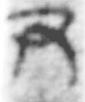尹
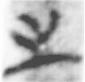之
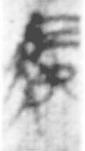駟
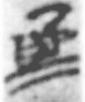爲
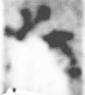○（左）
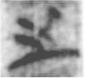之
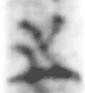之
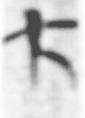大（太）
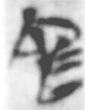官
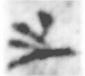之
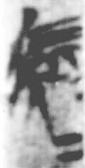駟
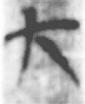大
